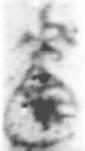○（韔）
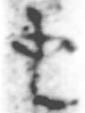屯
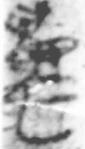○（貍）
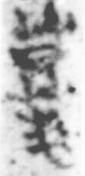○（貘）
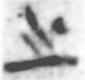之
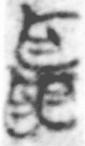聶（攝）
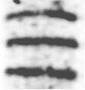三
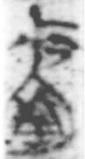○（箙）
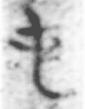屯
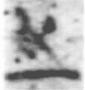之
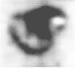四
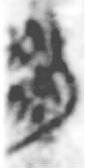○（絶）
